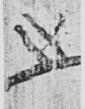之
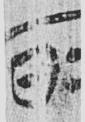一日
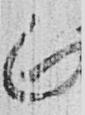㠯（以）
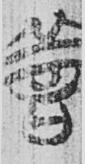善
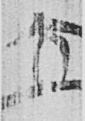立
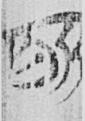所
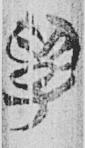○（學）
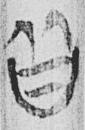皆
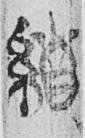終
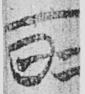一日
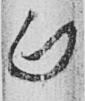㠯（以）
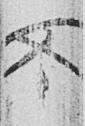不
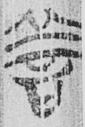善
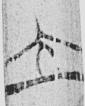立
